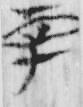辛
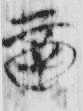酉
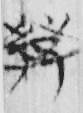登
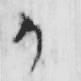人
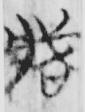戕
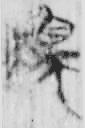燭
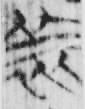羕
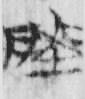陵
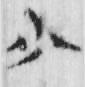少
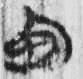甸
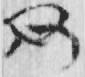尹
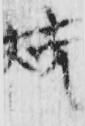燒
